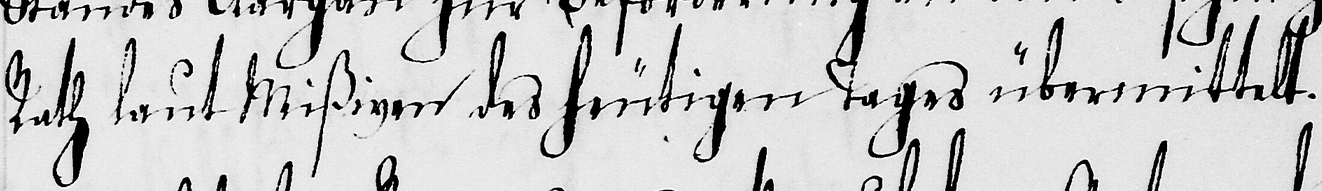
Rath laut Mißiven des heutigen Tages übermittelt.
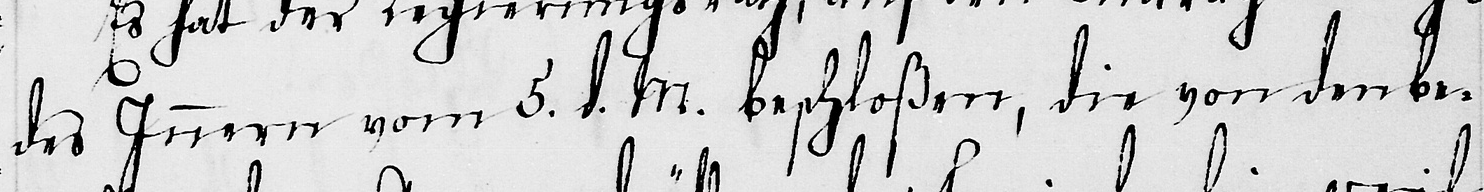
des Innern vom 5. d. M. beschloßen, die von den be¬
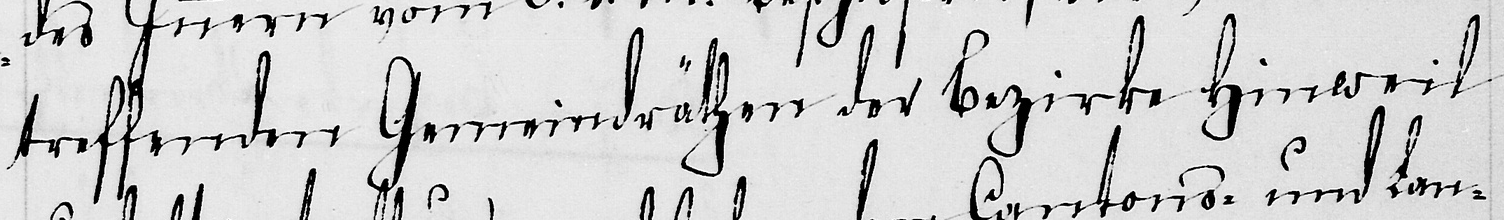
treffenden Gemeindräthen der Bezirke Hinweil
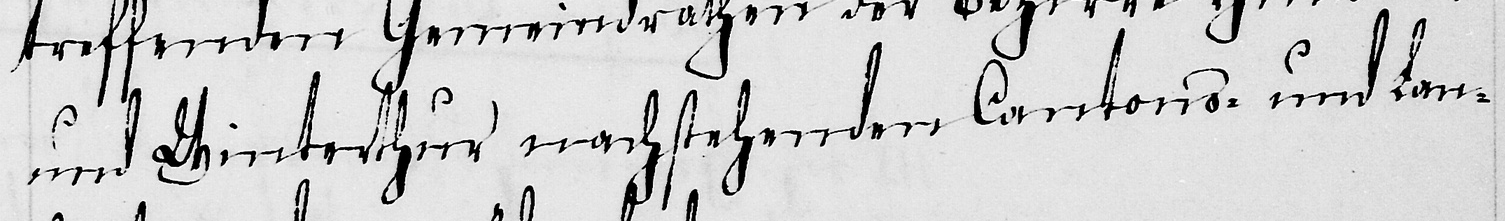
und Winterthur nachstehenden Cantons- und Lan¬
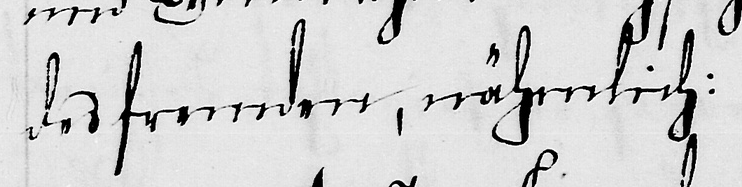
desfremden, nähmlich:
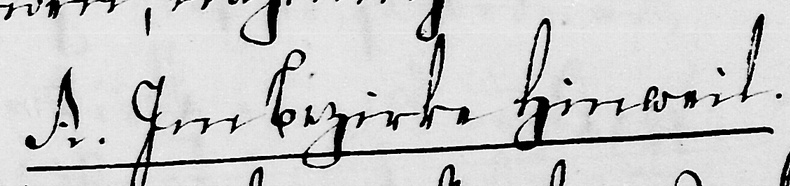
A. Im Bezirke Hinweil.
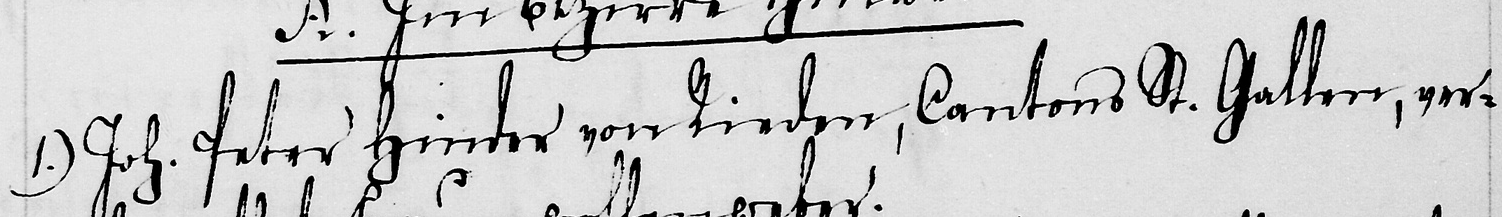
1.) Joh. Peter Hinder von Rieden, Cantons St. Gallen, ver¬
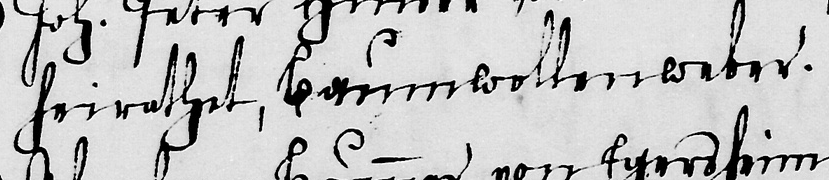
heirathet, Baumwollenweber.
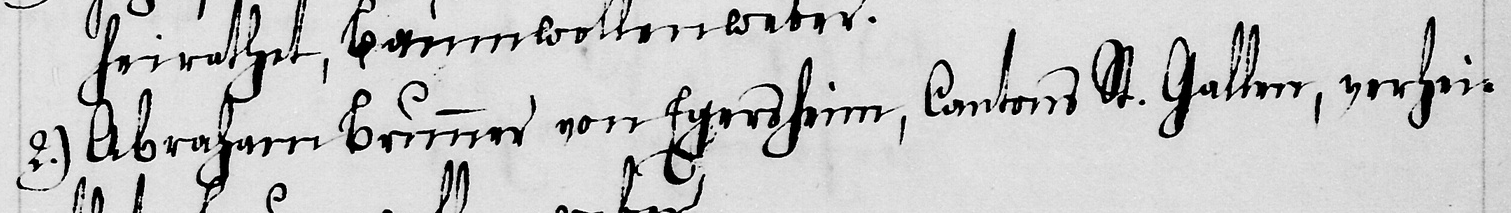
2.) Abraham Brunner von Egersheim, Cantons St. Gallen, verhei¬
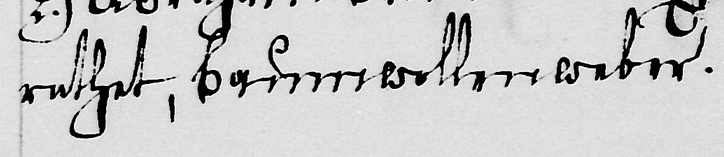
ratet, Baumwollenweber.
